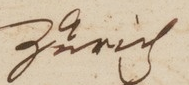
Zürich
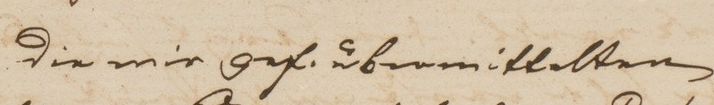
Die mir gef. übermittelten
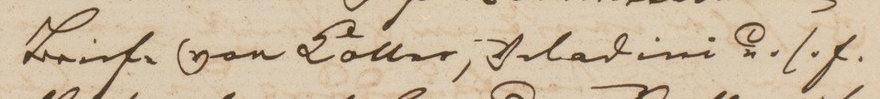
Briefe von Koller, Veladini u. s. f.
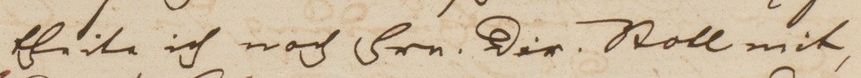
theile noch Hrn. Dir. Stoll mit,
